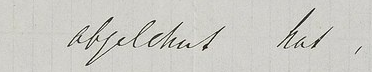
abgelehnt hat,
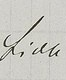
Sie aus
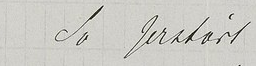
So zerstört
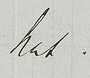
der
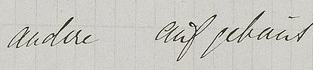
andere aufgebaut
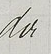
hat.
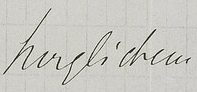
herzlichem
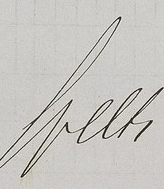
Welti
